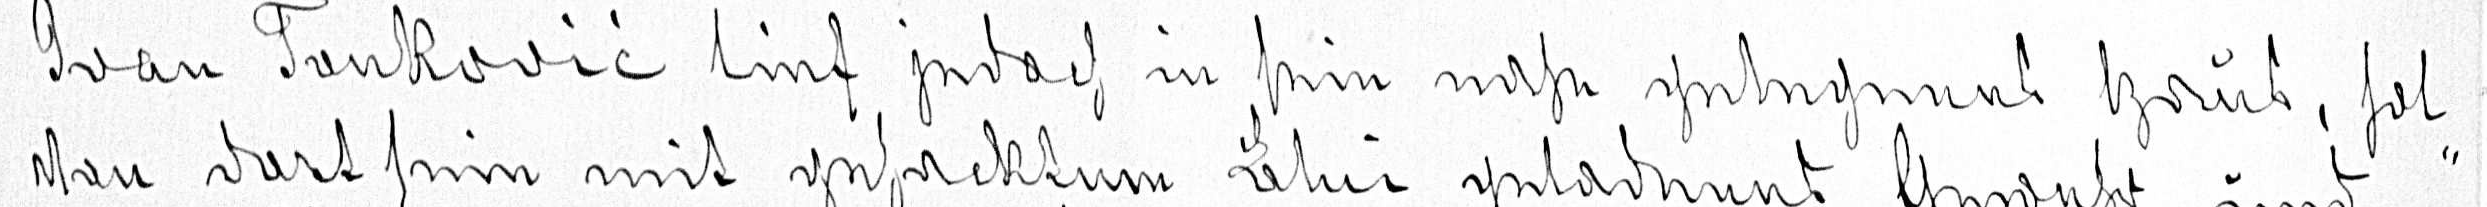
Ivan Tonković lief jedoch in sein nahe gelegenes Haus, hol¬
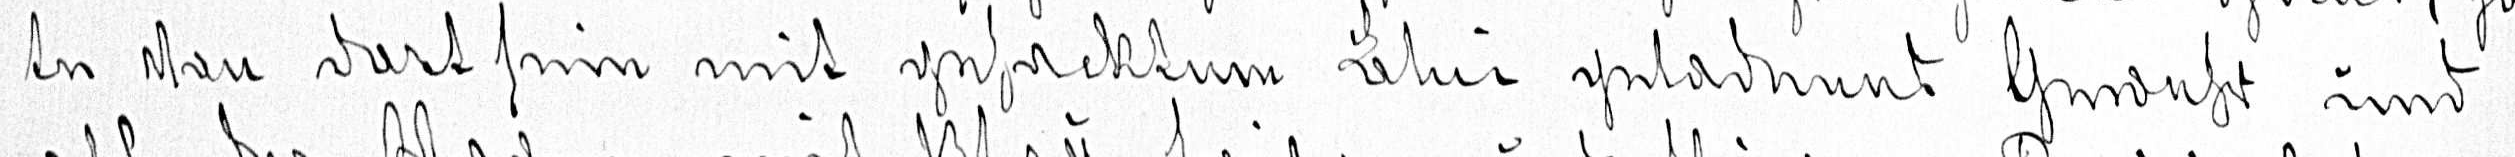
te von dort sein mit gehacktem Blei geladenes Gewehr und
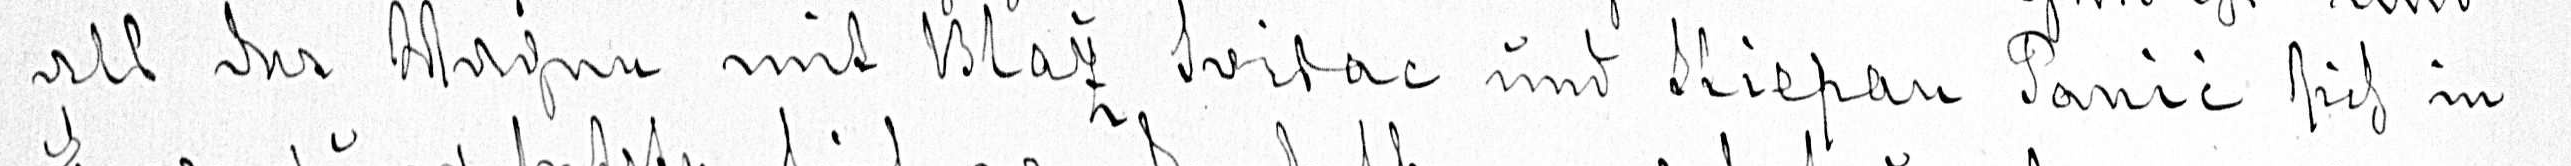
als der Wagen mit Blaž Svirac und Stiepan Panić sich in
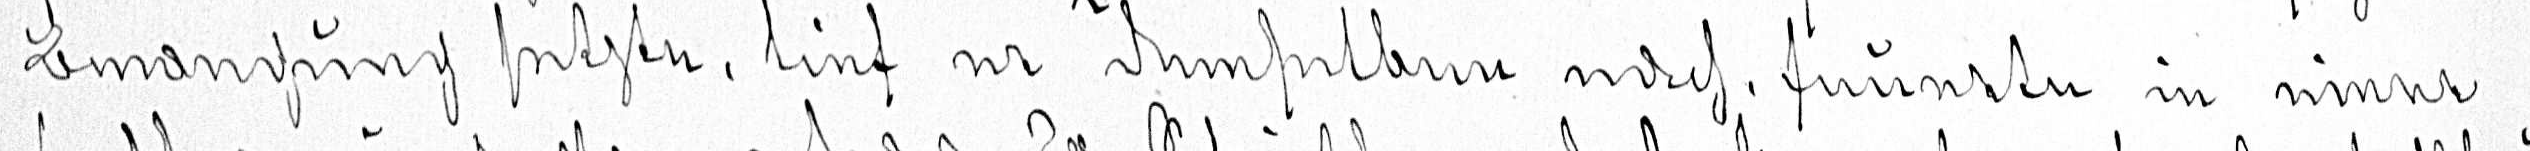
Bewegung setzte, lief er demselben nach, feuerte in einer
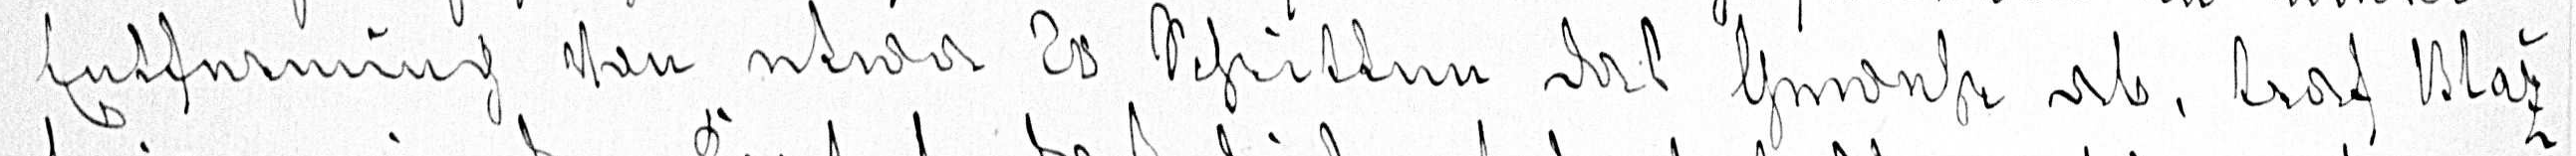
Entfernung von etwa 20 Schritten das Gewehr ab, traf Blaž
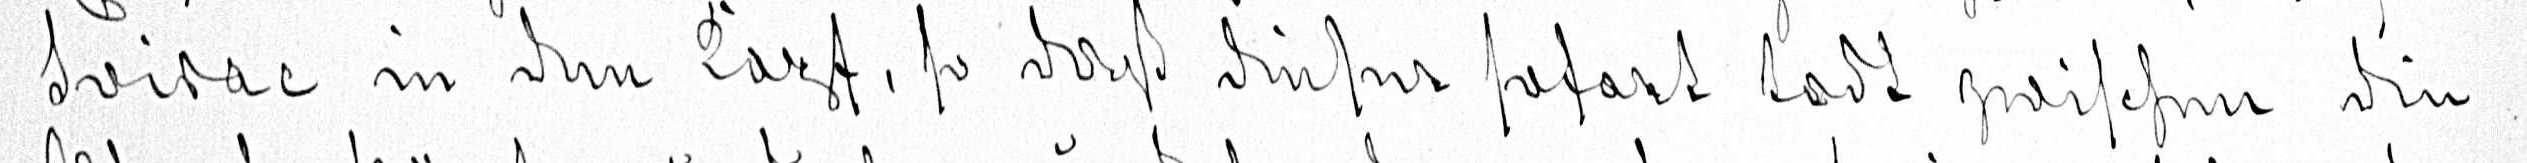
Svirac in den Kopf, so daß dieser sofort todt zwischen die
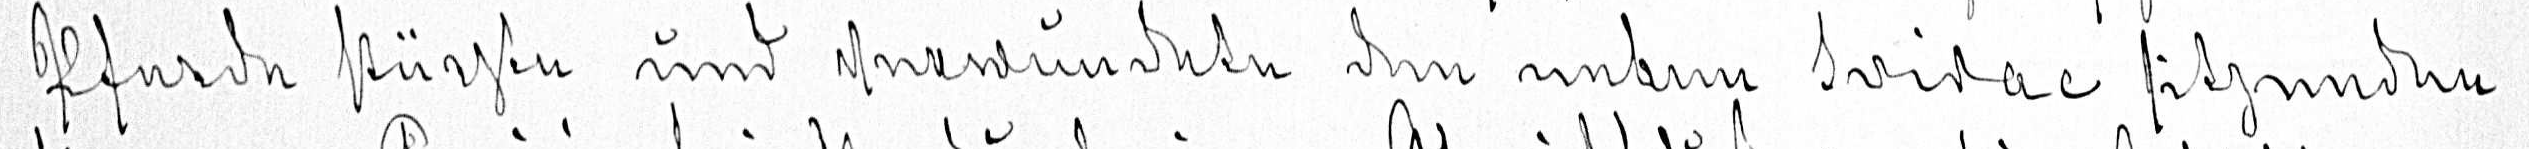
Pferde stürzte und verwundete den neben Svirac sitzenden
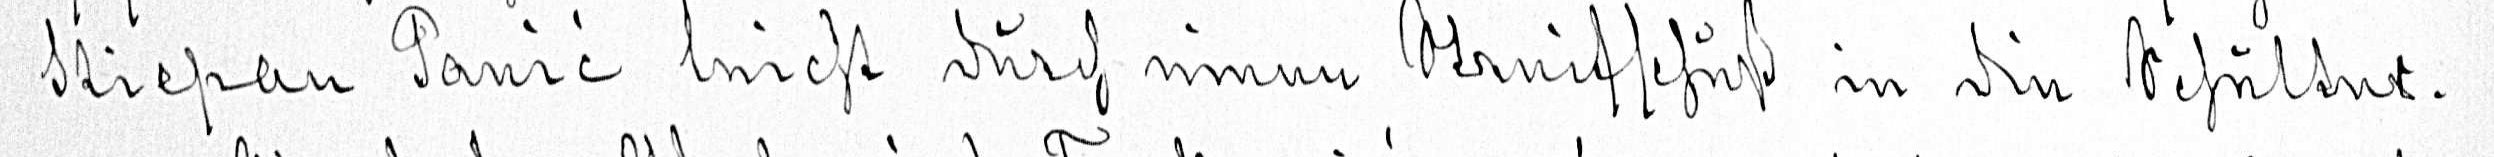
Stiepan Panić leicht durch einer Streifschuß in die Schulter.
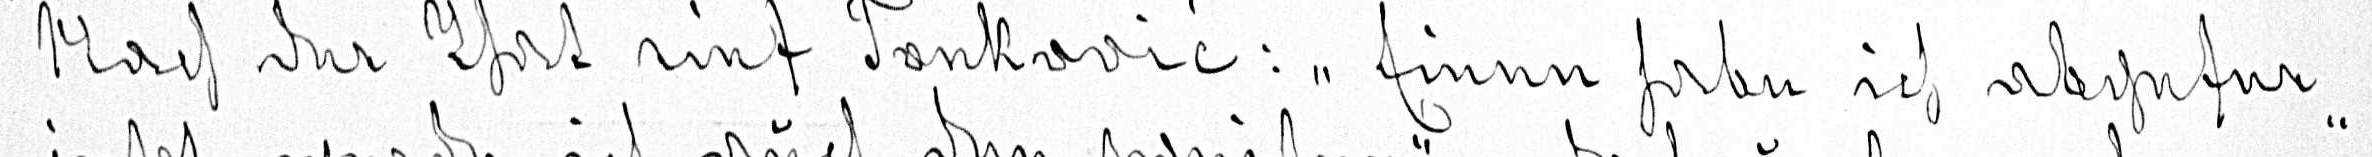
Nach der That rief Tonković: „Einen habe ich abgefer¬
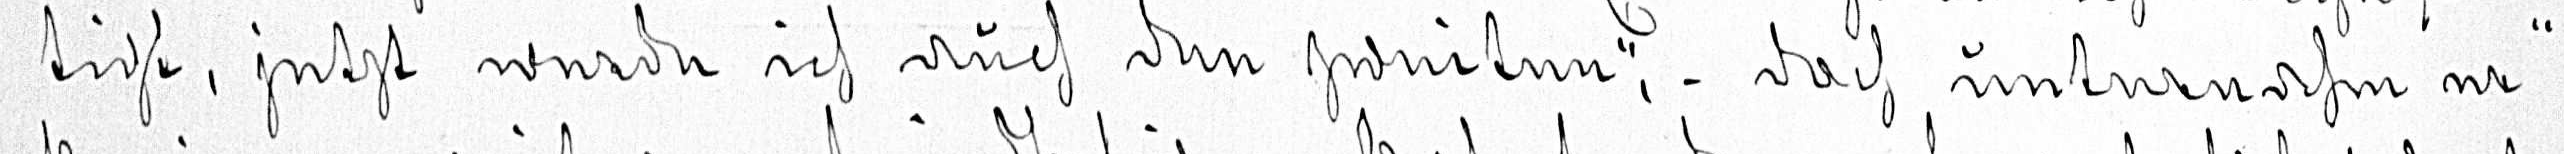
tigt, jetzt werde ich auch den zweiten,“ – doch unternahm er
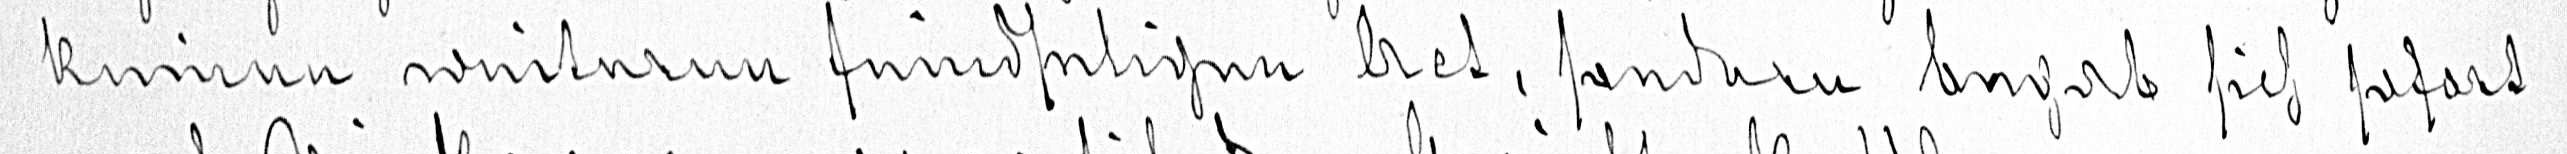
keinen weiteren feindseligen Act, sondern begab sich sofort
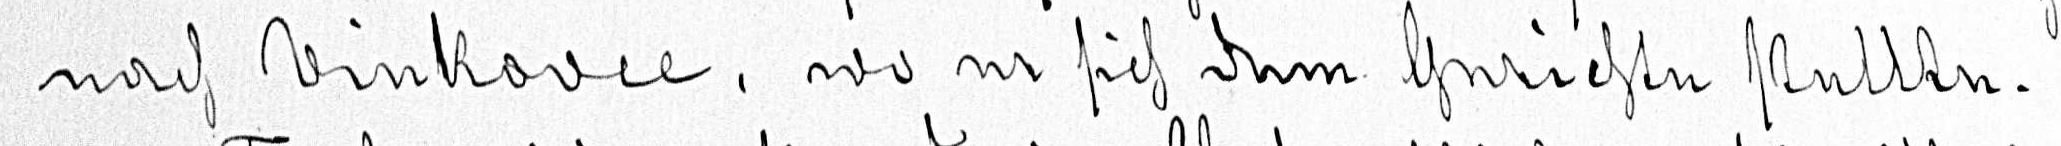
nach Vinkovce, wo er sich dem Gerichte stellte.
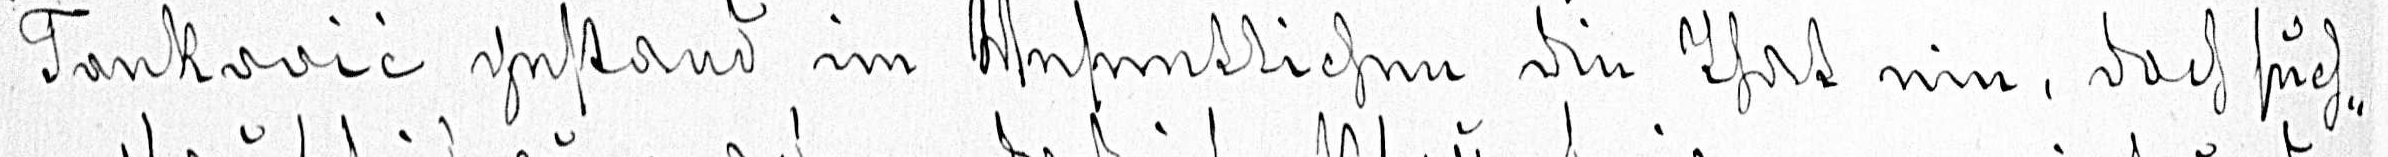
Tonković gestand im Wesentlichen die That ein, doch such¬
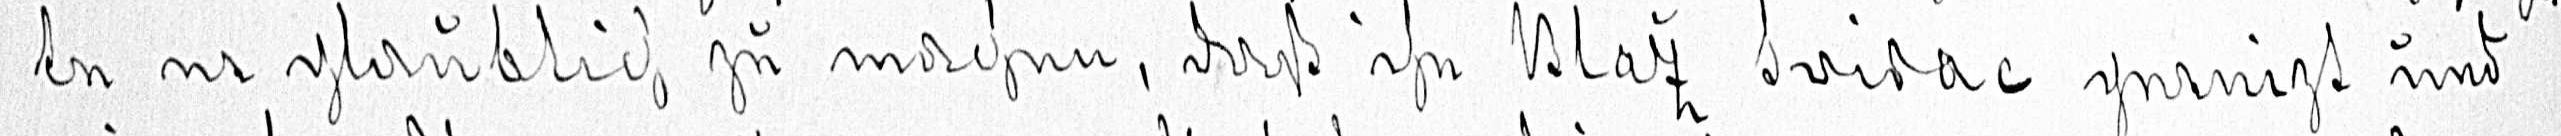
te er glaublich zu machen, daß ihn Blaž Svirac gereizt und
